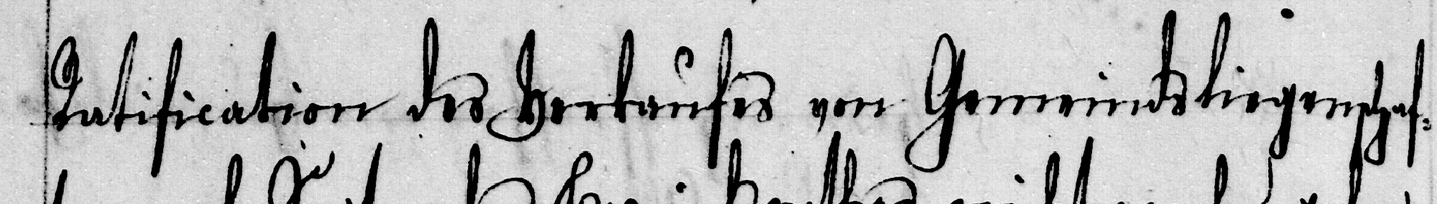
Ratification des Verkaufes von Gemeindsliegensch¬
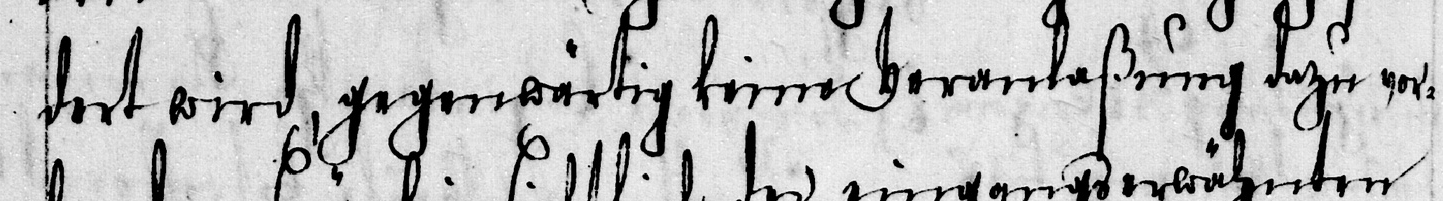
dert wird, gegenwärtig keine Veranlaßung dazu vor¬
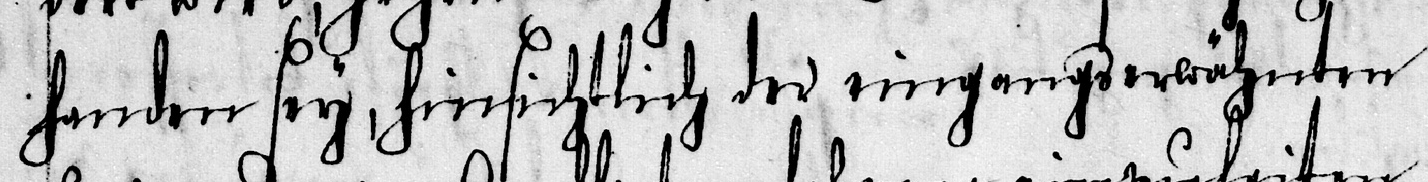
handen sey, hinsichtlich der eingangserwähnten
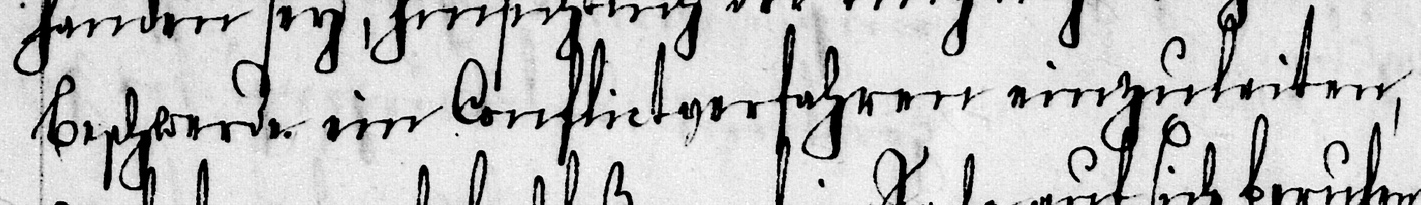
Beschwerde ein Conflictverfahren einzuleiten,
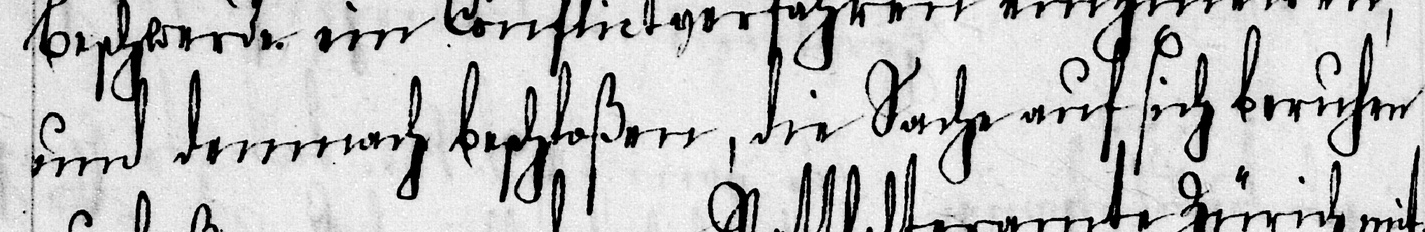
und demnach beschloßen, die Sache auf sich beruhen
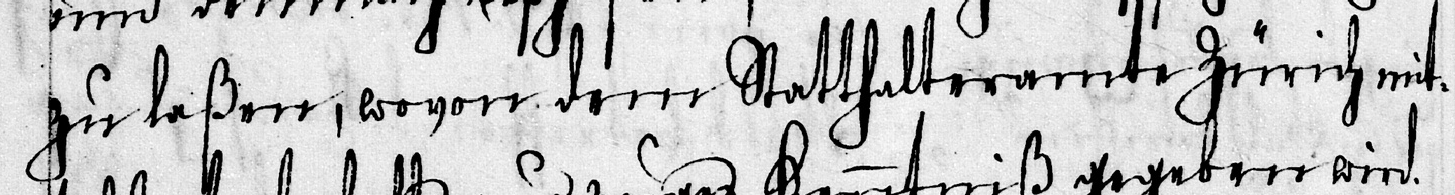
zu laßen, wovon dem Statthalteramte Zürich mit¬
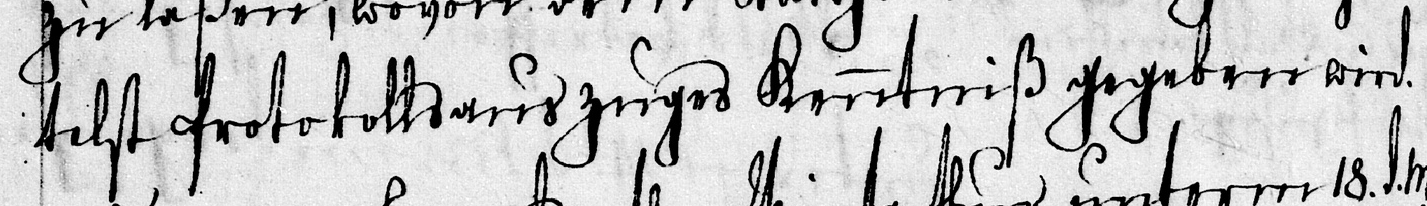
telst Protokollsauszuges Kenntniß gegeben wird.
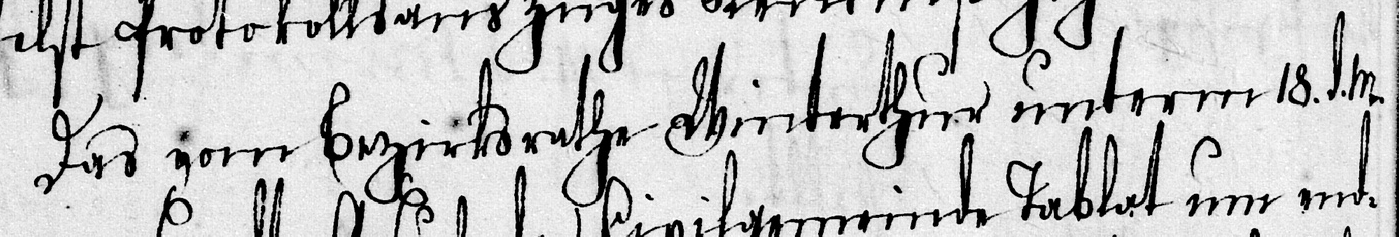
Das vom Bezirksrathe Winterthur unterm 18. d.
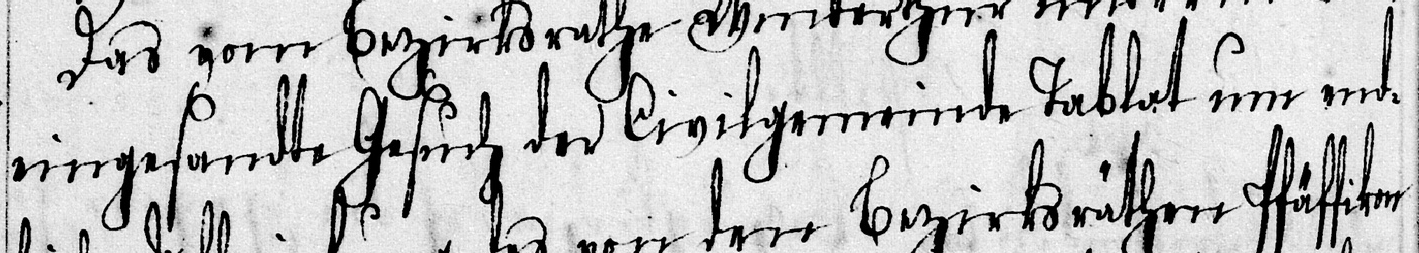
eingesandte Gesuch der Civilgemeinde Tablat um end¬
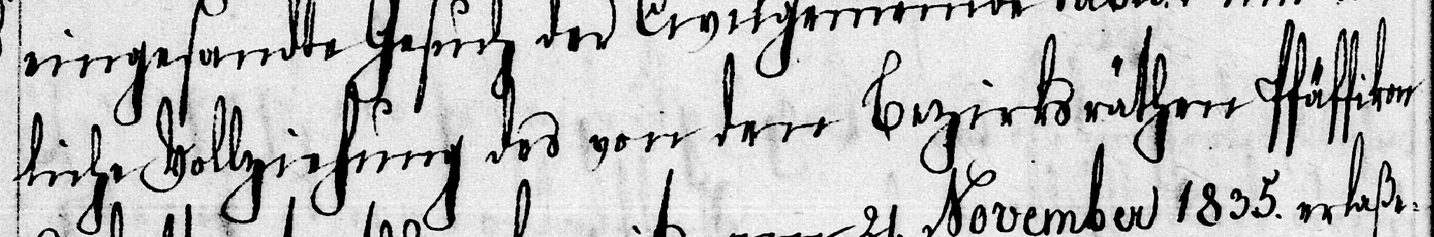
liche Vollziehung des von den Bezirksräthen Pfäffikon
